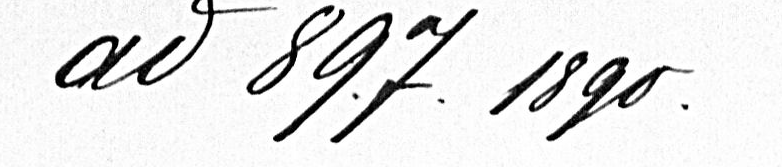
ad 897. 1890.
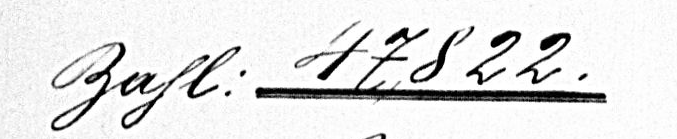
Zahl: 47822.
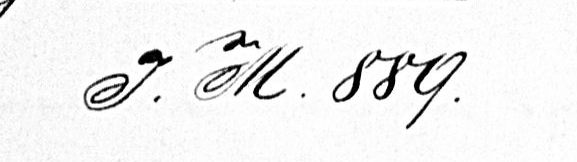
J. M. 889.
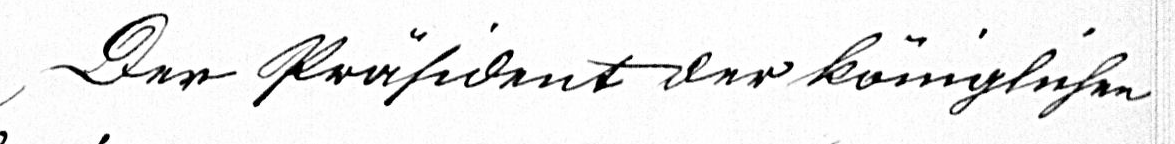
Der Präsident der königlichen
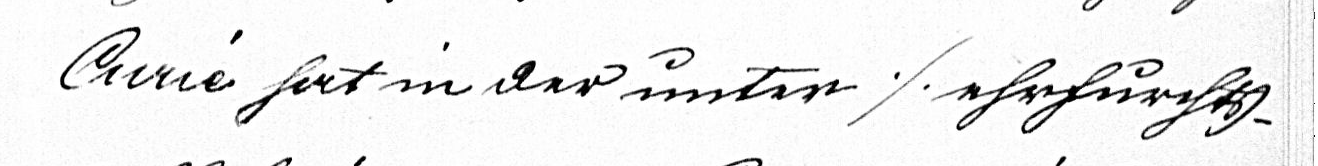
Curie hat in der unten./. ehrfurchts¬
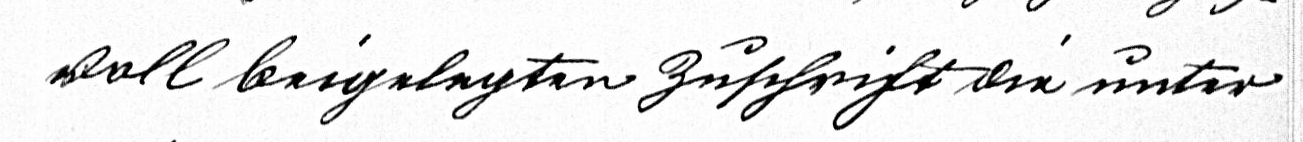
voll beigelegten Zuschrift die unter
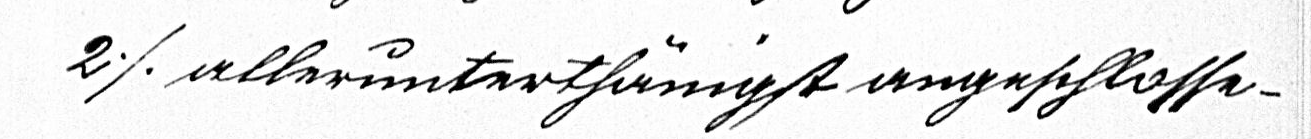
2./. allerunterthänigst angeschlosse¬
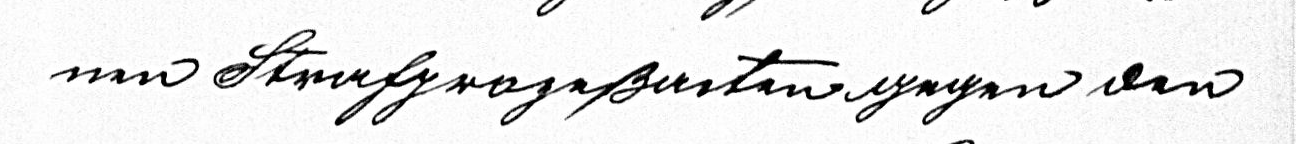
nen Strafprozeßarten gegen den
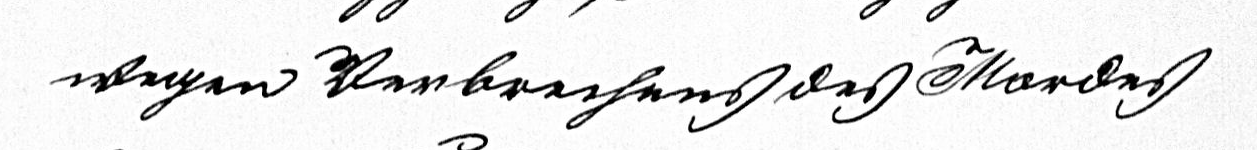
wegen Verbrechens des Mordes
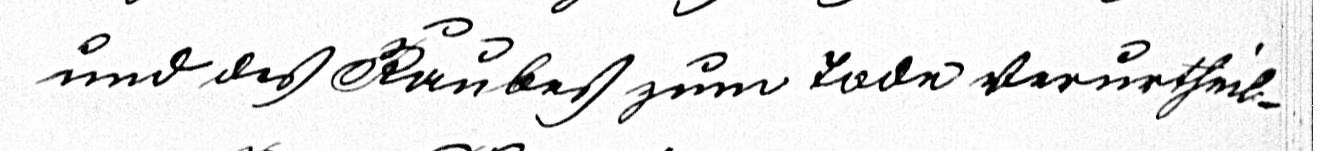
und des Raubes zum Tode verurtheil¬
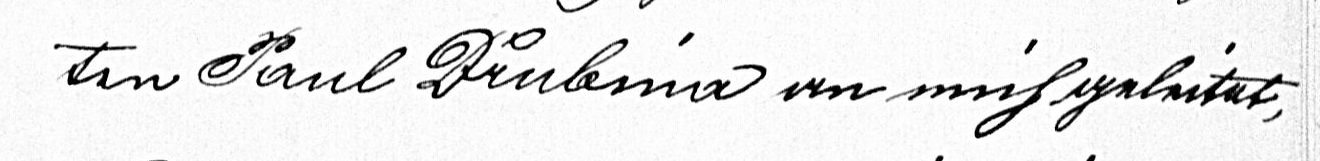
ten Paul Drubina an mich geleitet,
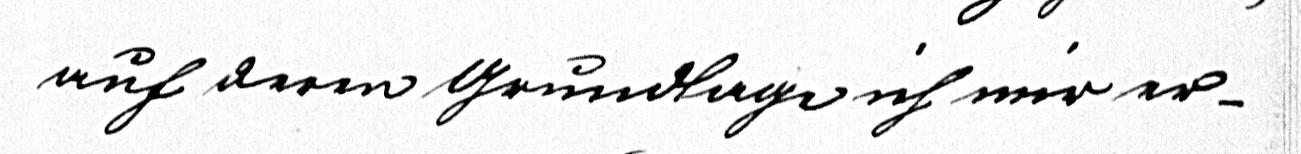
auf deren Grundlage ich mir er¬
